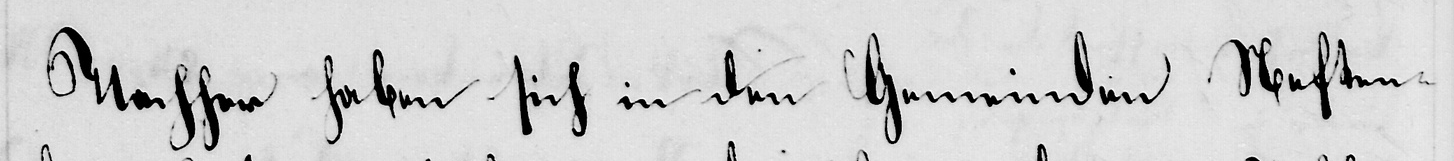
Nachher haben sich in den Gemeinden Neften¬
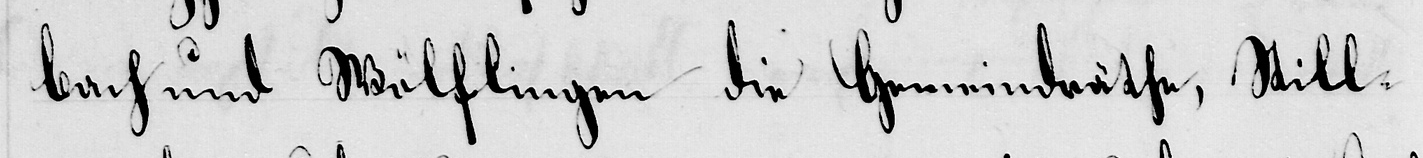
bach und Wülflingen die Gemeindräthe, Still¬
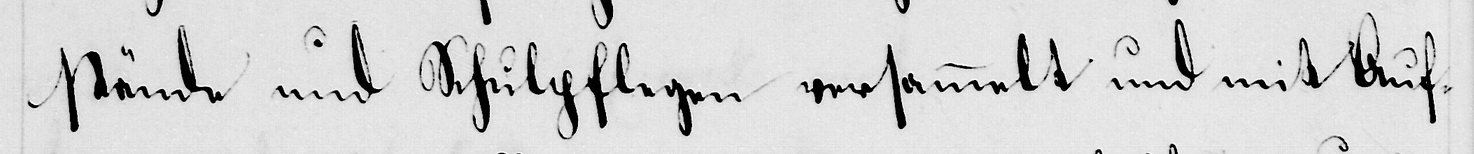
stände und Schulpflegen versammelt und mit Auf¬
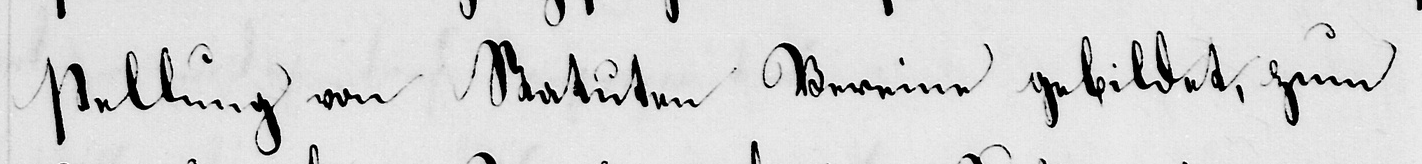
stellung von Statuten Vereine gebildet, zum
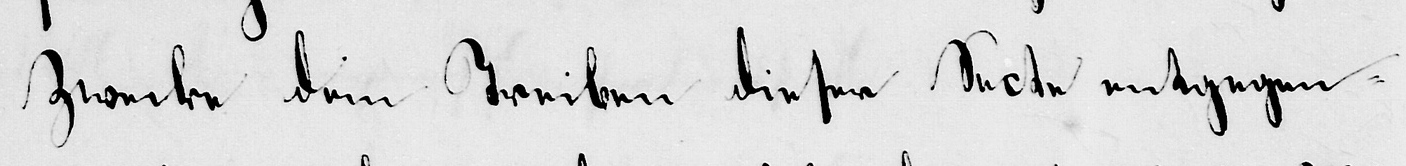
Zwecke dem Treiben dieser Secte entgegen¬
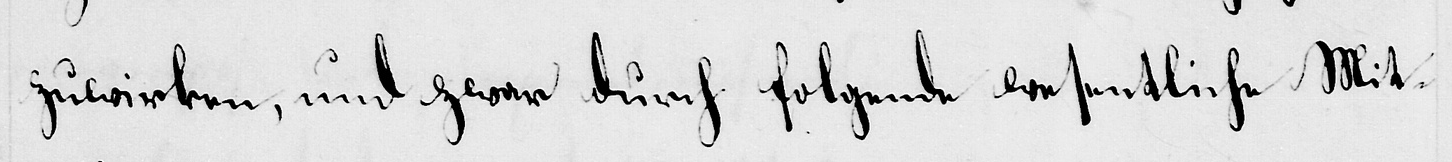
zuwirken, und zwar durch folgende wesentliche Mit¬
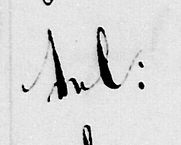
tel:
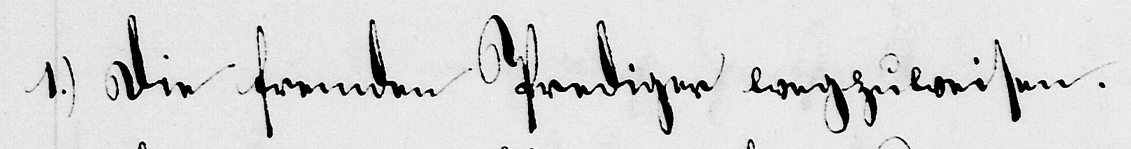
1.) Die fremden Prediger wegzuweisen.
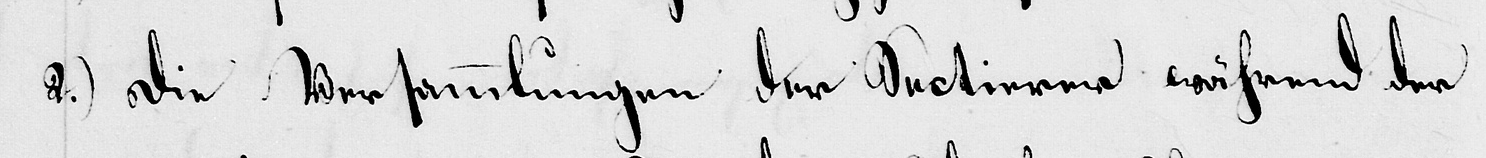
2.) Die Versammlungen der Sectierer während der
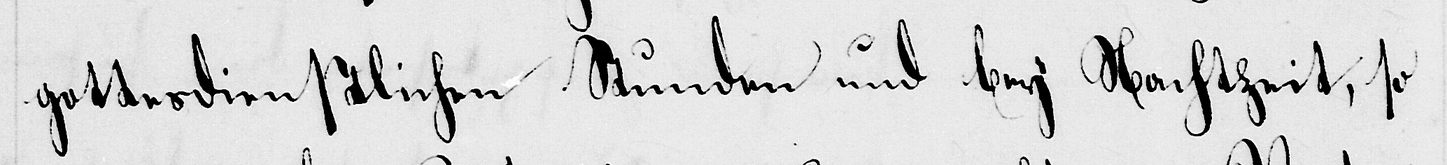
gottesdienstlichen Stunden und bey Nachtzeit, so
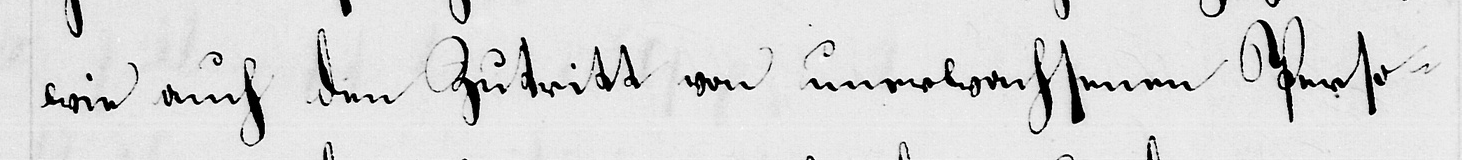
wie auch den Zutritt von unerwachsenen Perso¬
